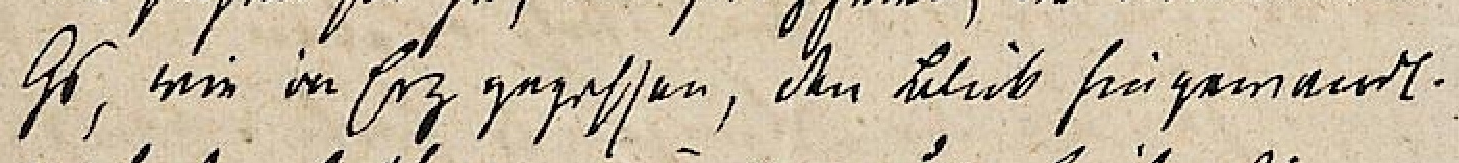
Gs, wie in Erz gegossen, den Blick hingewandt.
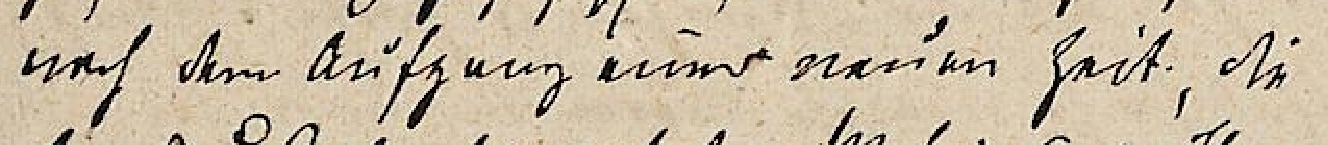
nach dem Aufgang einer neuen Zeit, die
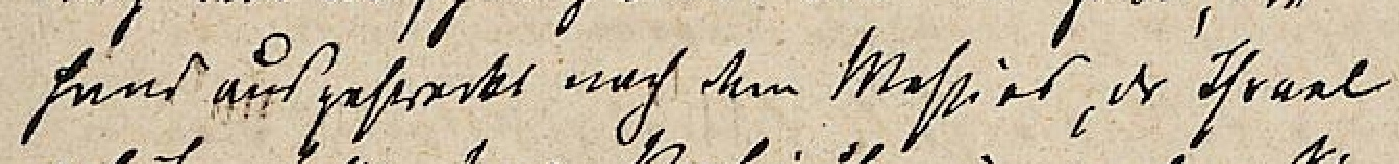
Hand ausgestreckt nach dem Messias, dr Israel
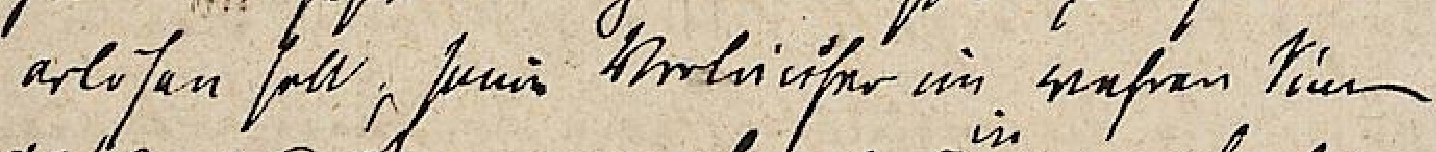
erlösen soll, seine Voläufer in wahren Sinn
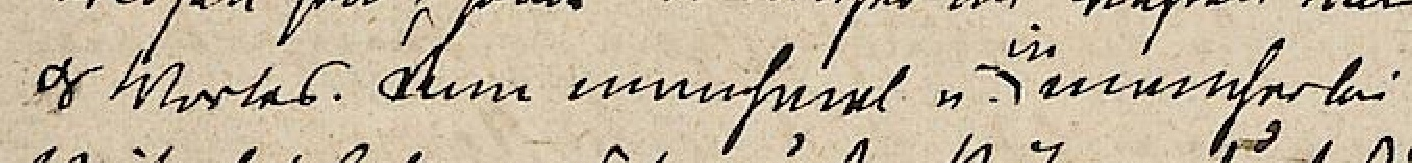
ds Wortes. Denn manchmal u in mancherlei
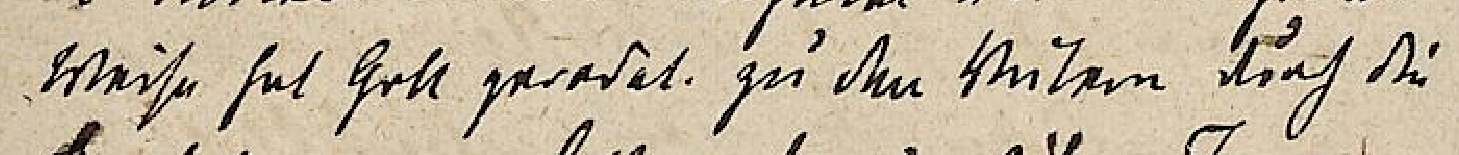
Weise hat Gott geredet zu den Vätern durch die
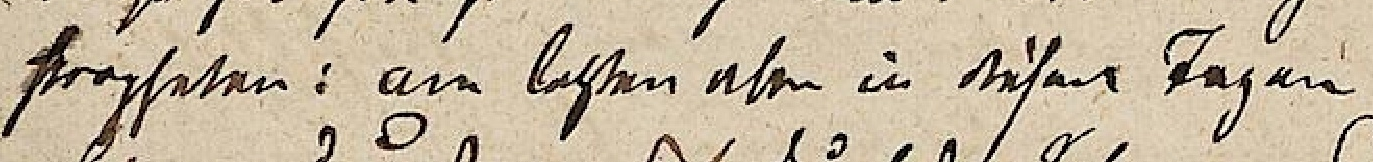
Propheten: am letzten eben in diesen Tagen
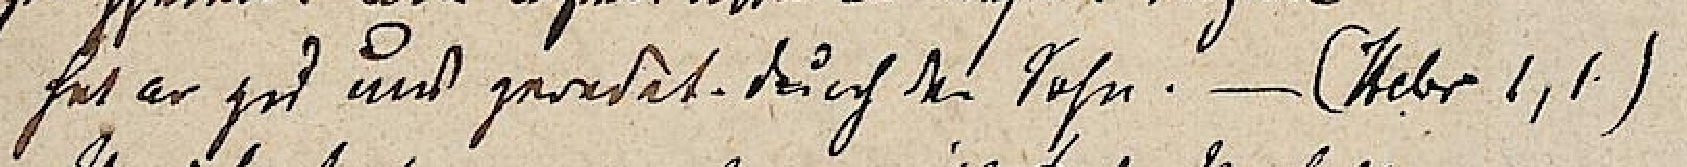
jat er zu uns geredet durch den Sohn _ (Hebr 1,1)
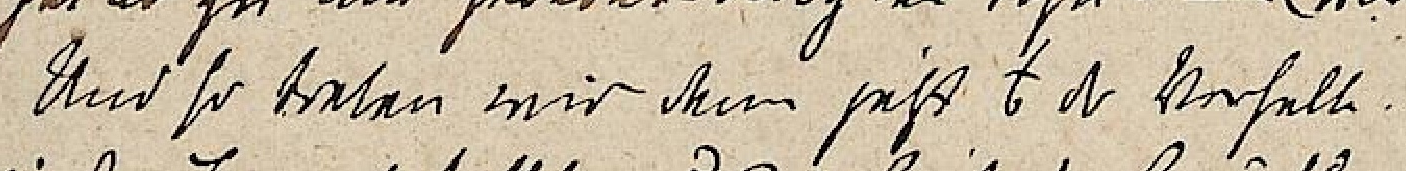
Und so treten wir denn jetzt s dr Vorhalle.
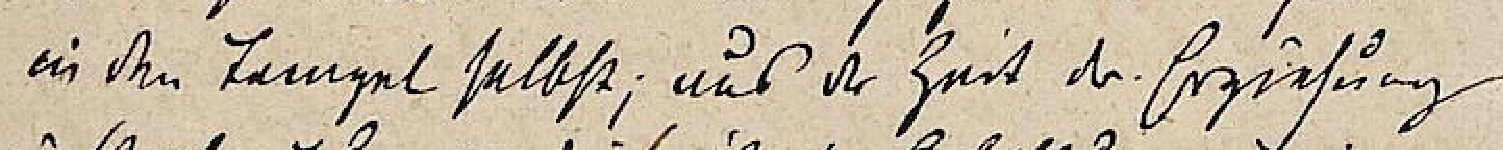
in dem Tempel selbst, aus dr Zeit der Erziehung
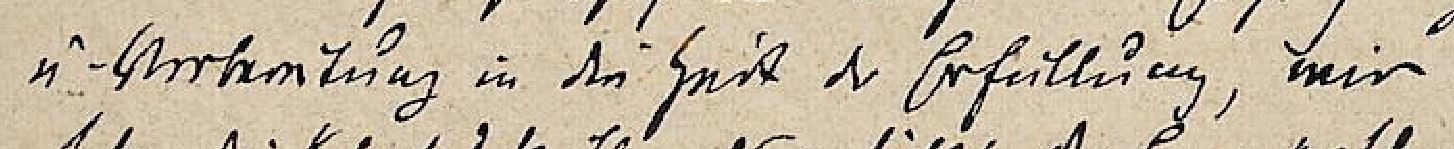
u. Vorbereitung in die Zeit der Erfüllung, wir
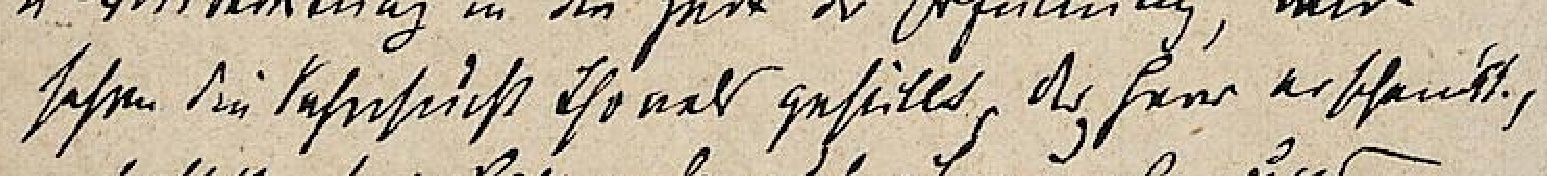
sehen die Sehnsucht Israels gestillt, ds Herr erscheint,
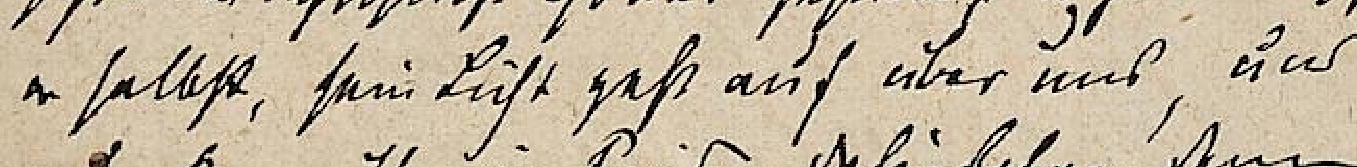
er selbst, sein Licht geht auf über uns, und
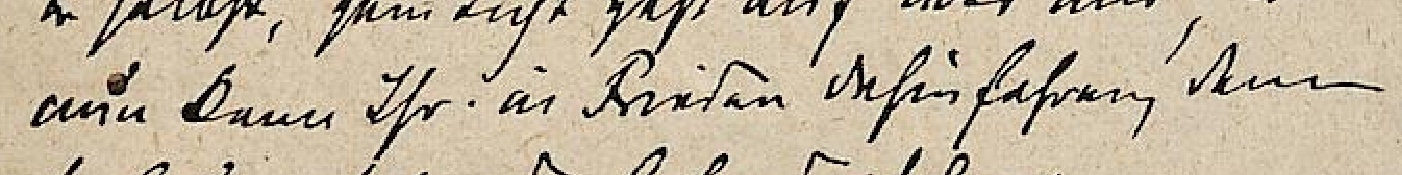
nun kann Isr. in Frieden dahinfahren, denn
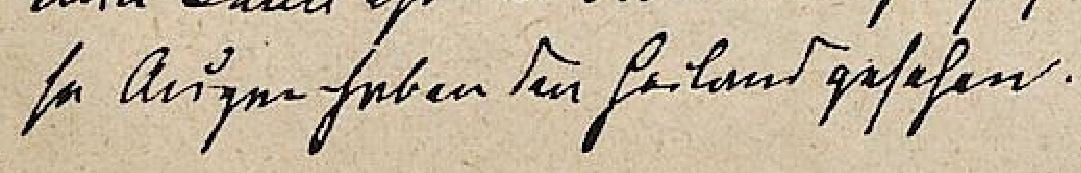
sn Augen haben den Heiland gesehen.
